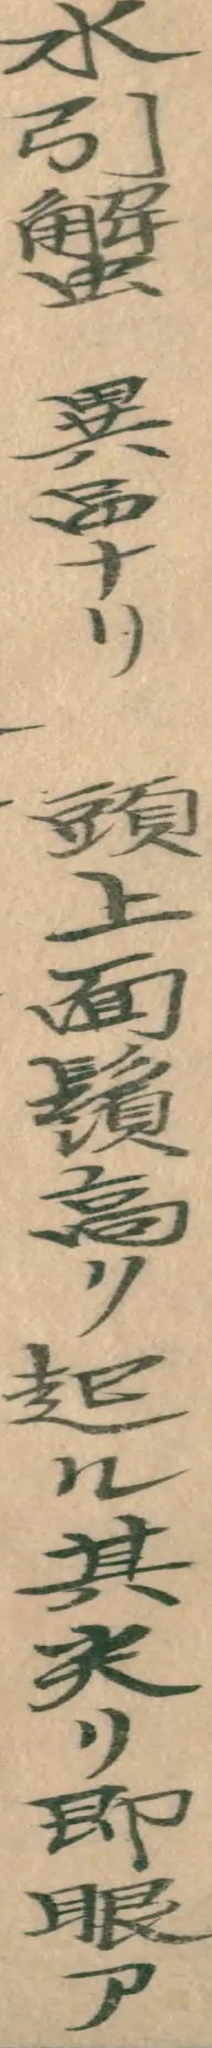水引蟹異品ナリ頭上面鬚高ク起ル其尖リ即眼ア
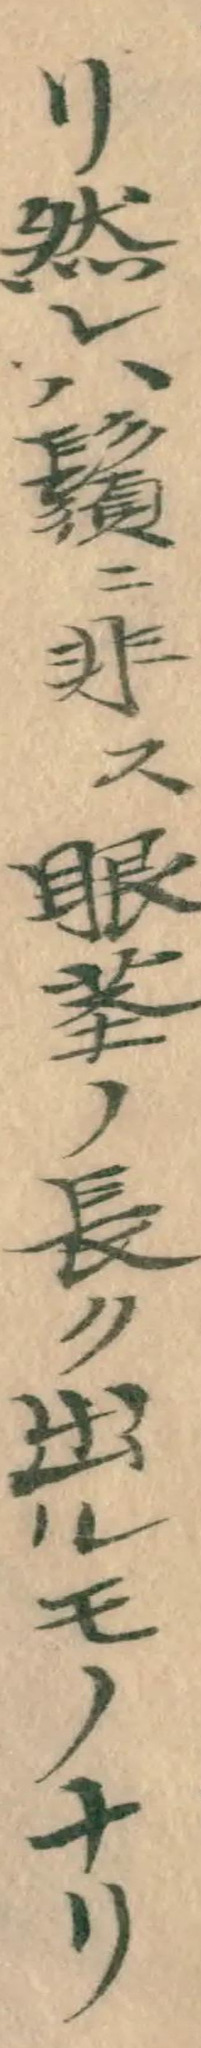リ然レハ鬚ニ非ス眼茎ノ長ク出ルモノナリ
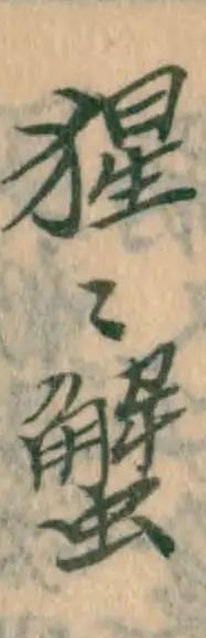猩々蟹
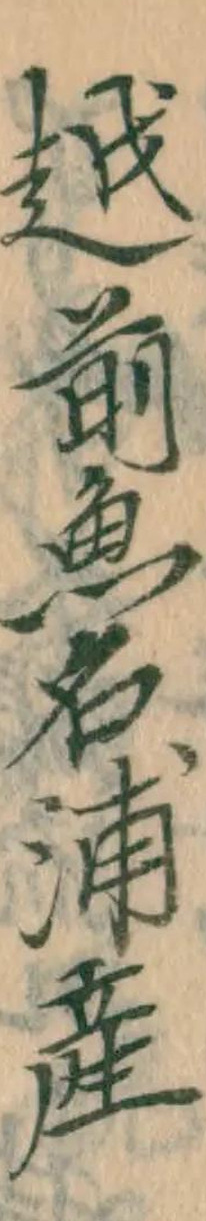越前魚名浦産
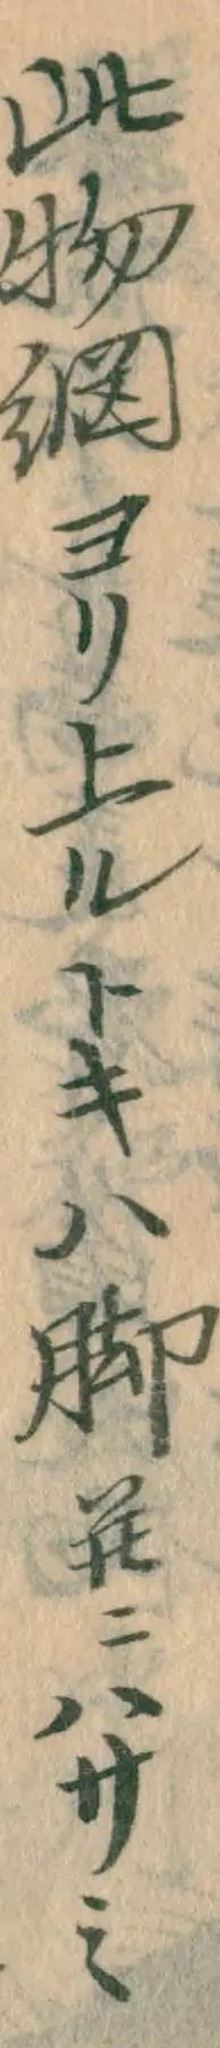此物網ヨリ上ルトキハ脚幷ニハサミ
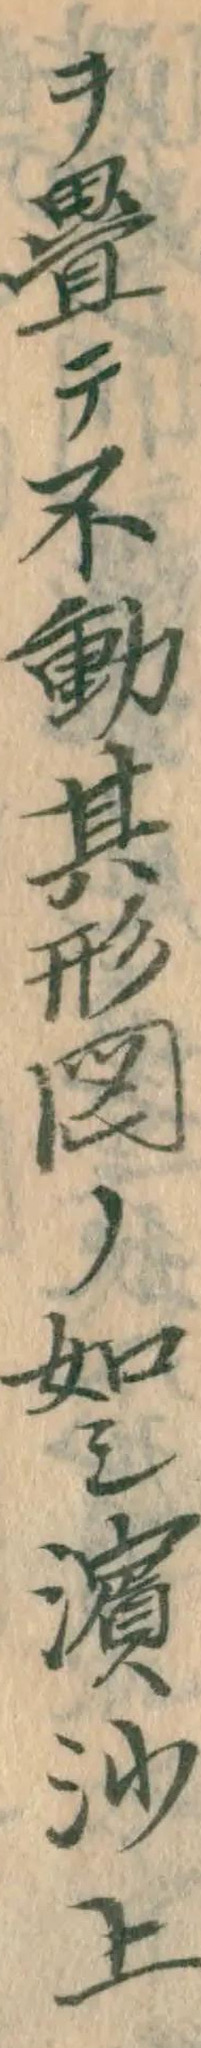ヲ畳テ不動其形図ノ如シ濱沙上
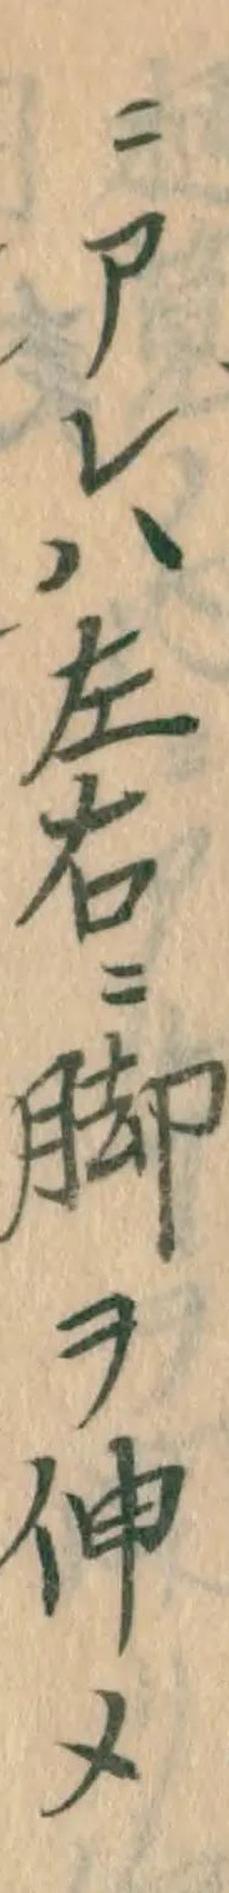ニアレハ左右ニ脚ヲ伸シテ
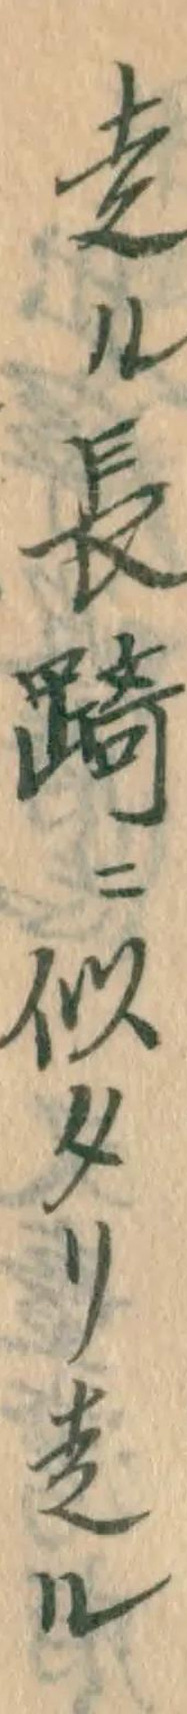走ル長踦ニ似タリ走ル

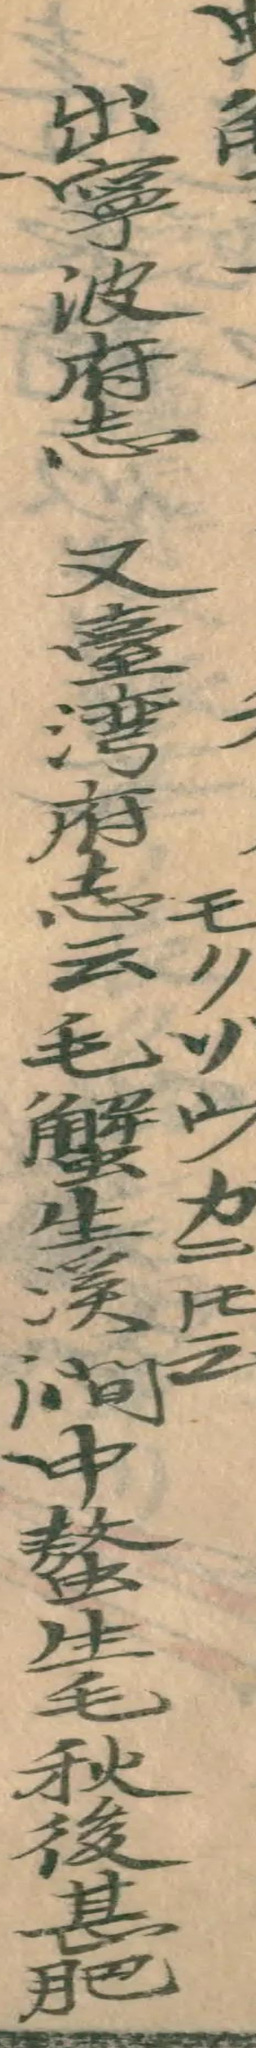出寧波府志又臺湾府志云毛蟹生渓澗中螯生毛秋後甚肥
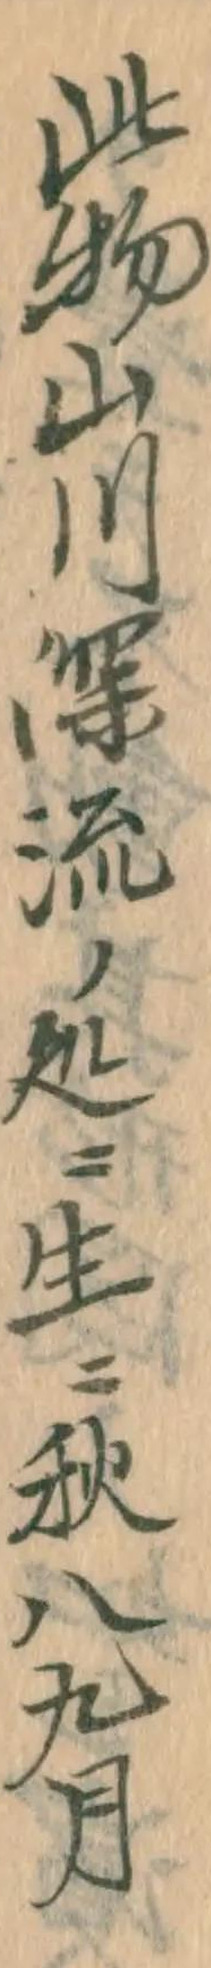此物山川深流ノ処ニ生ニ秋八九月
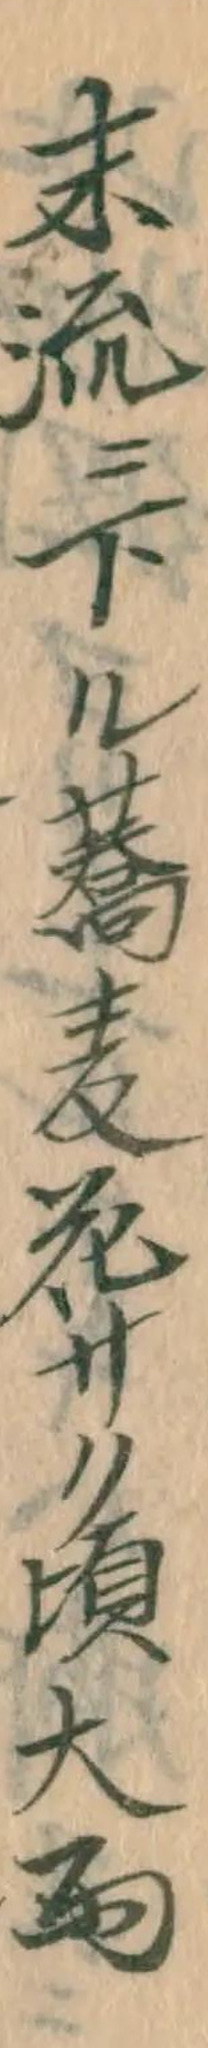末流ニ下ル蕎麦花サク頃大雨
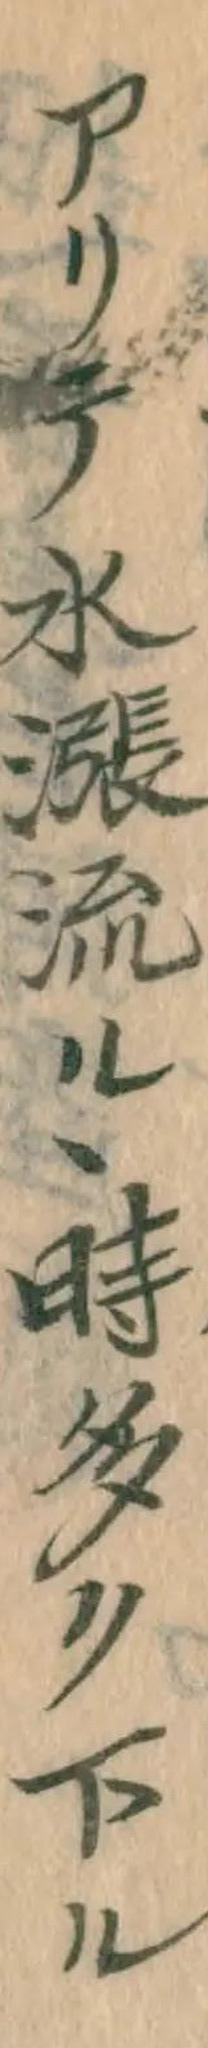アリテ水漲流ルヽ時多ク下ル
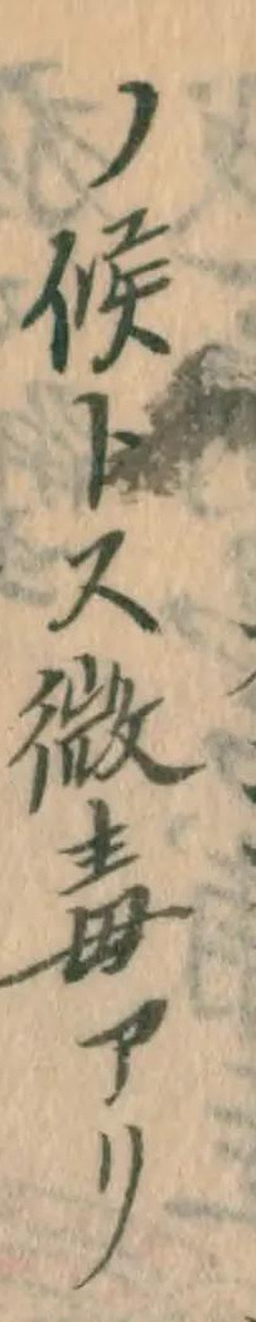ノ候トス微毒アリ
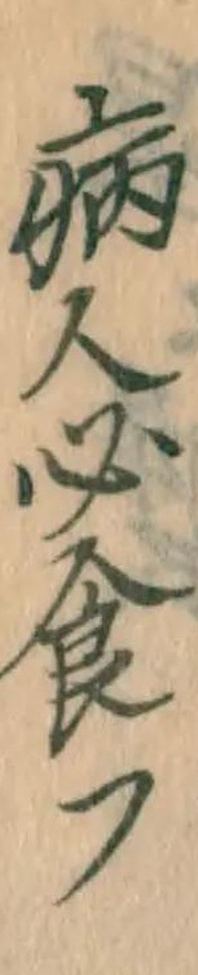病人必食フ
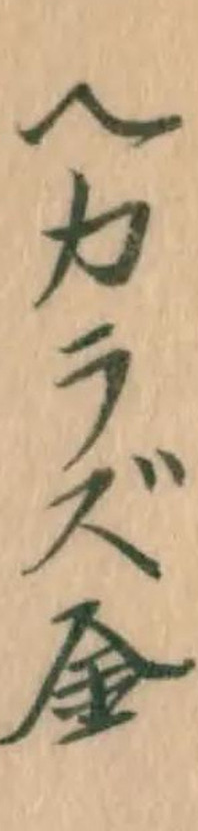ヘカラズ金
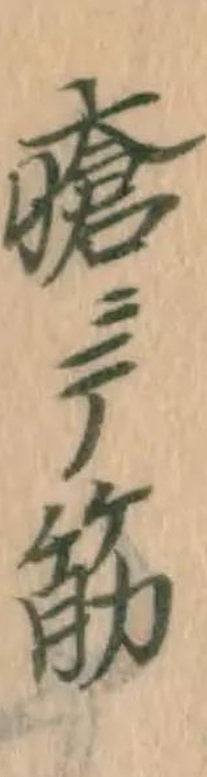瘡ニテ筋
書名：千蟲譜 3巻. [2]
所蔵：国立国会図書館 National Diet Library, JAPAN
